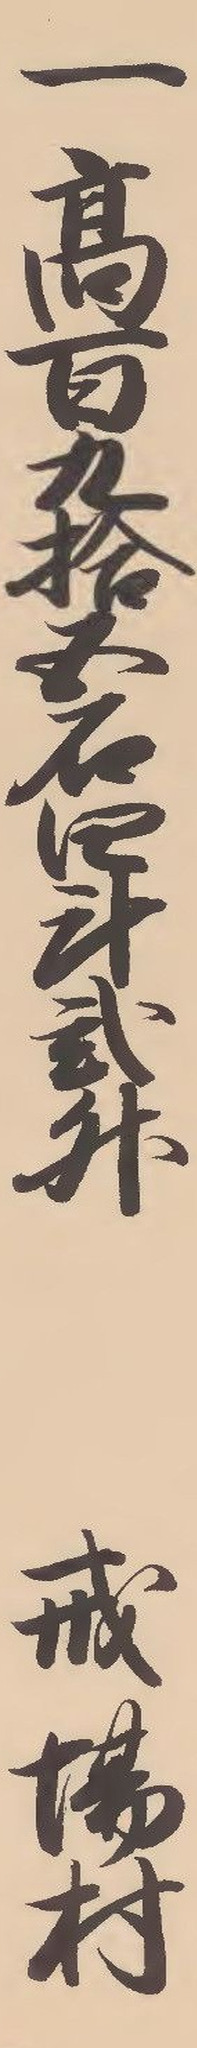一高百九拾五石四斗弐升戒場村
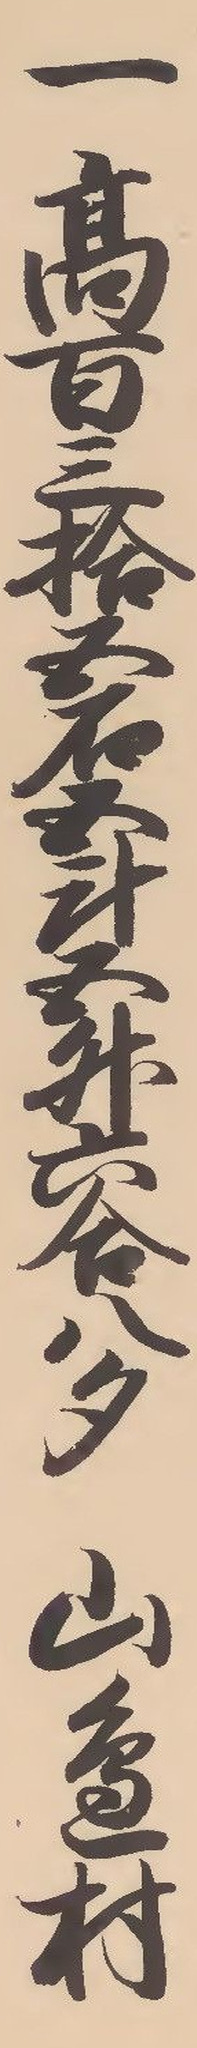一高百三拾五石五斗五升六合八勺山辺村

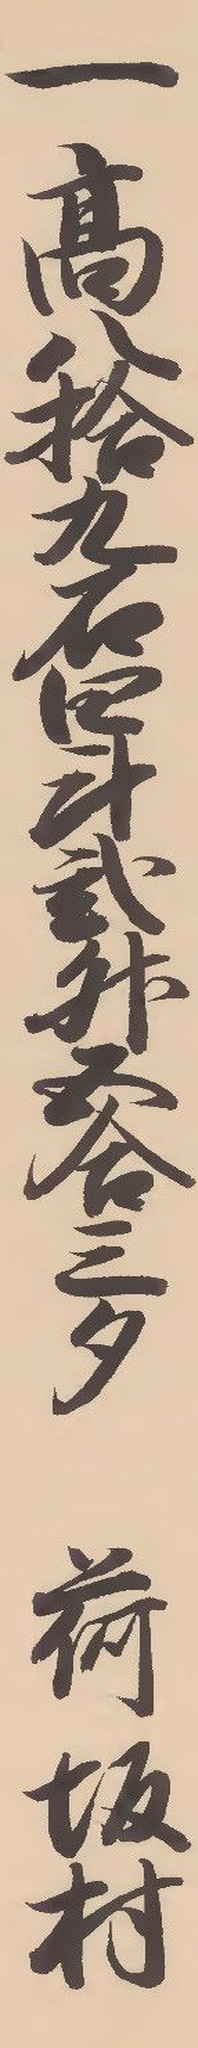一高八拾九石四斗弐升五合三勺荷坂村
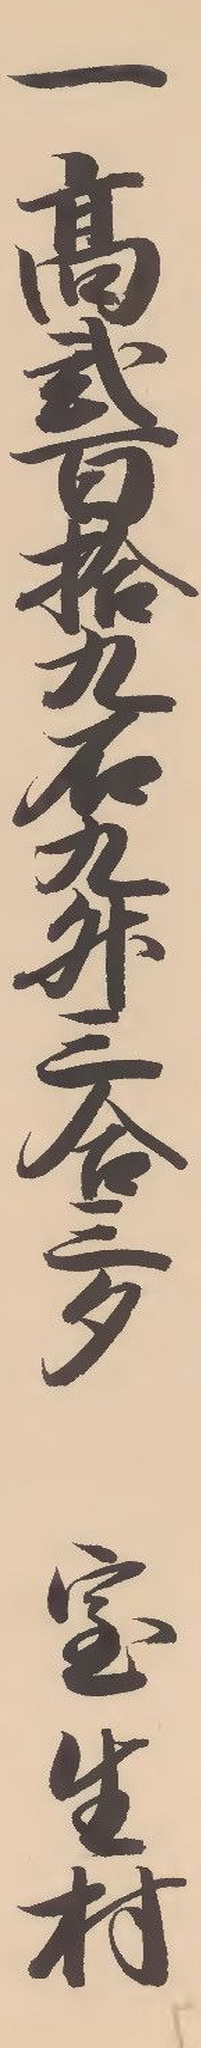一高弐百拾九石九升三合三勺室生村
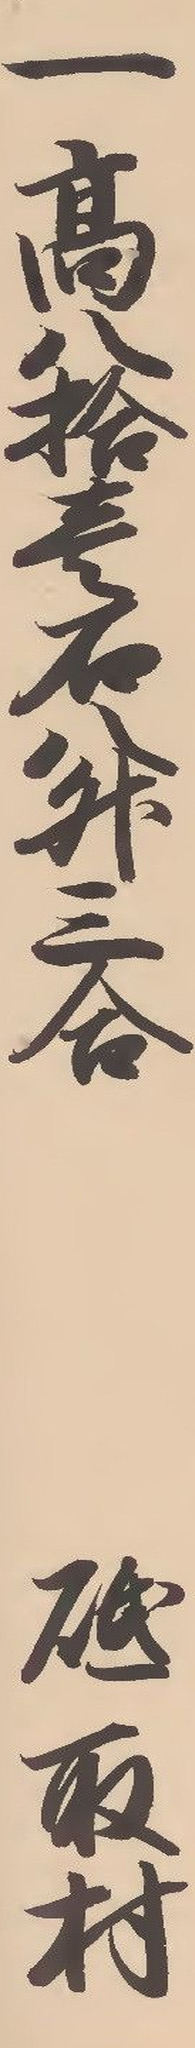一高八拾壱石八升三合砥取村
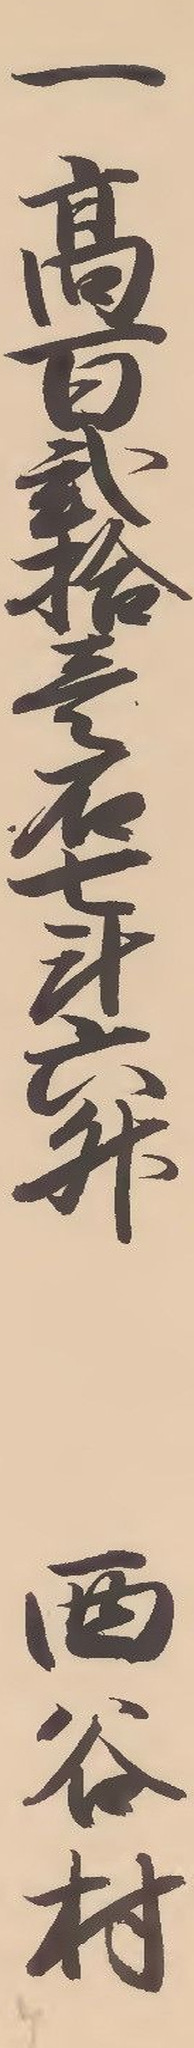一高百弐拾壱石七斗六升西谷村
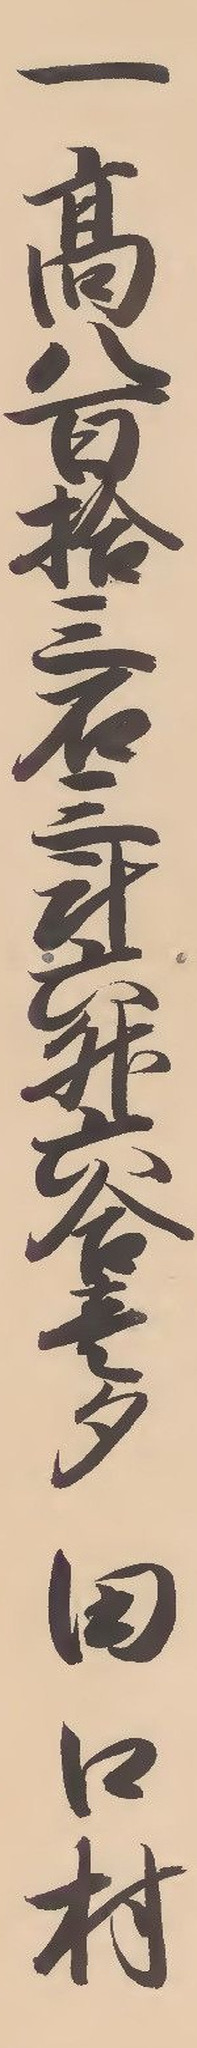一高八百拾三石三斗六升六合壱勺田口村

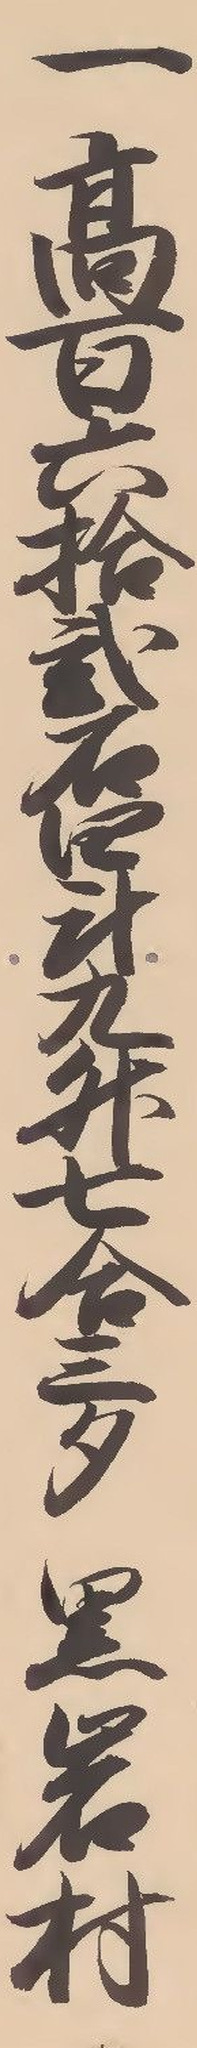一高百六拾弐石四斗九升七合三勺黒岩村
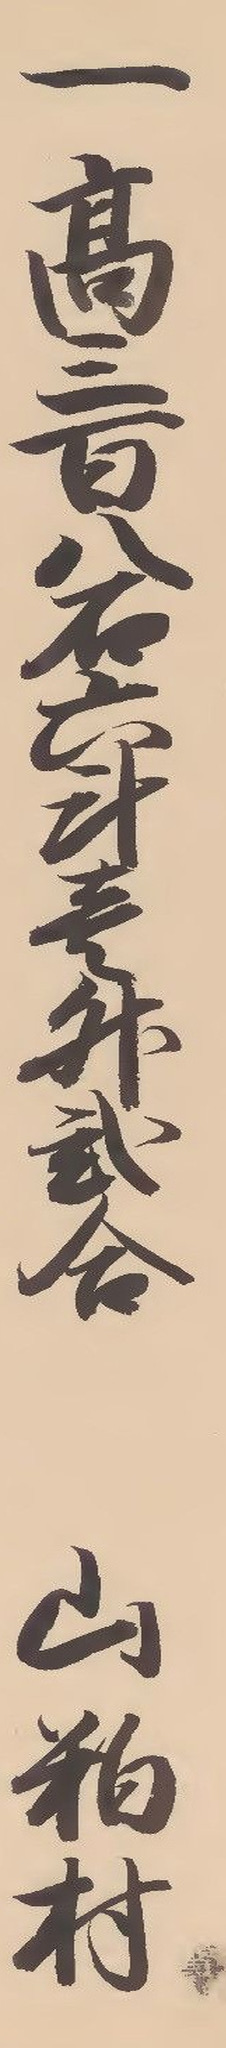一高三百八石六斗壱升弐合山粕村
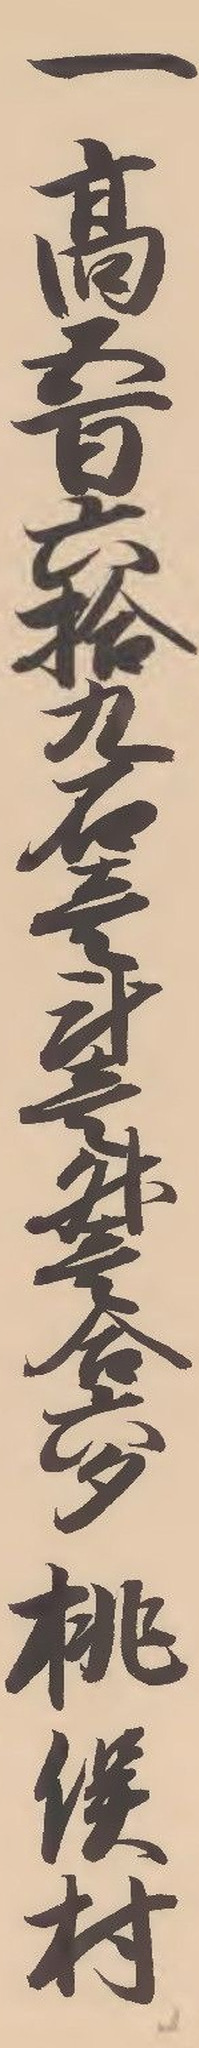一高五百六拾九石壱斗壱升壱合六勺桃俣村
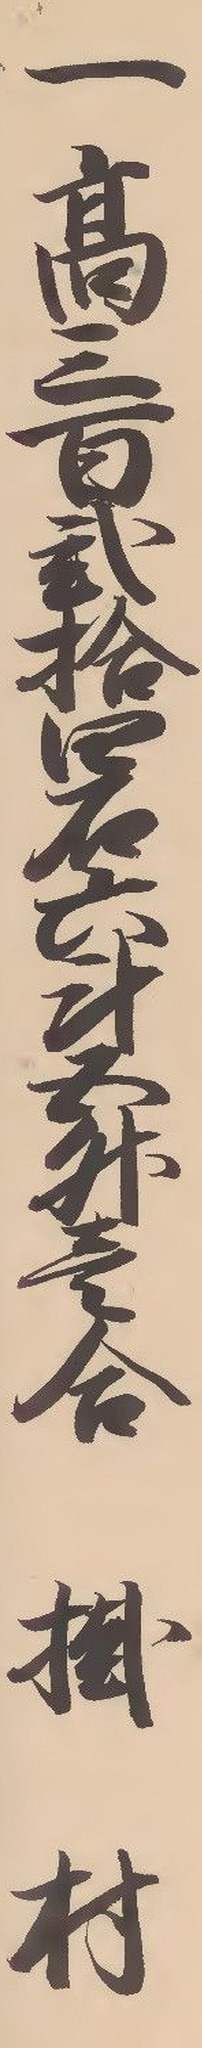一高三百弐拾四石六斗五升壱合掛村
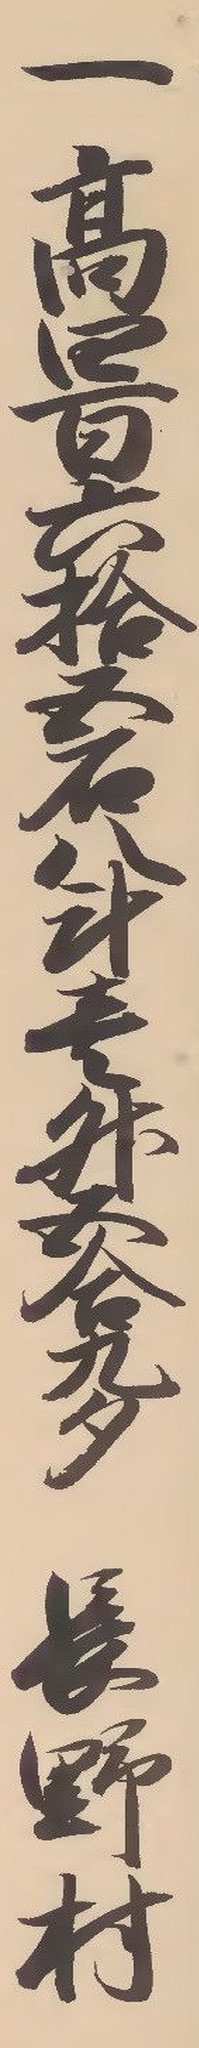一高四百六拾五石八斗壱升五合九勺長野村
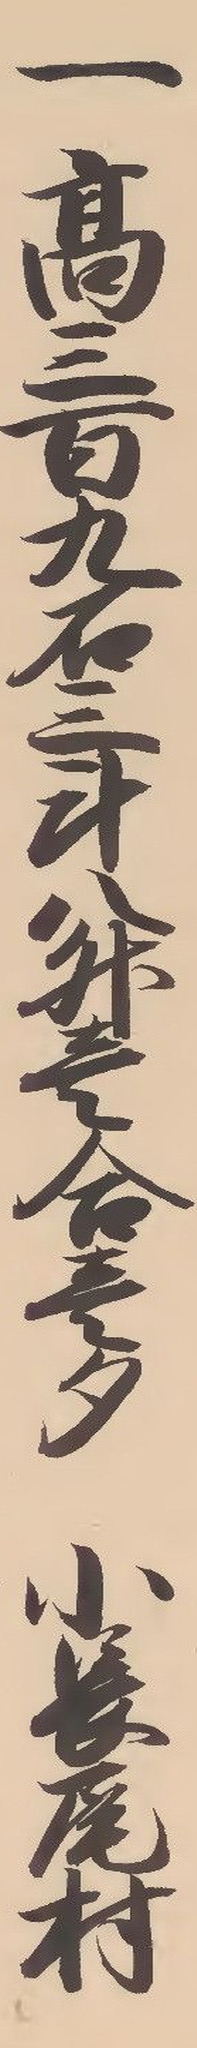一高三百九石三斗八升壱合壱勺小長尾村
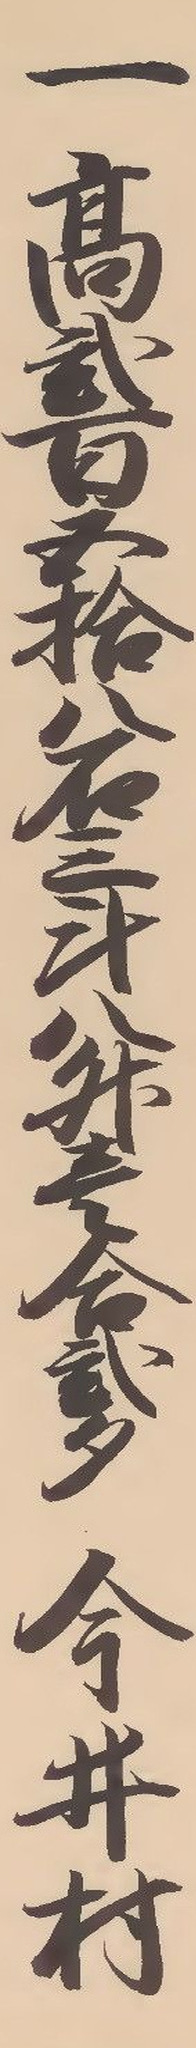一高弐百五拾八石三斗八升壱合弐勺今井村
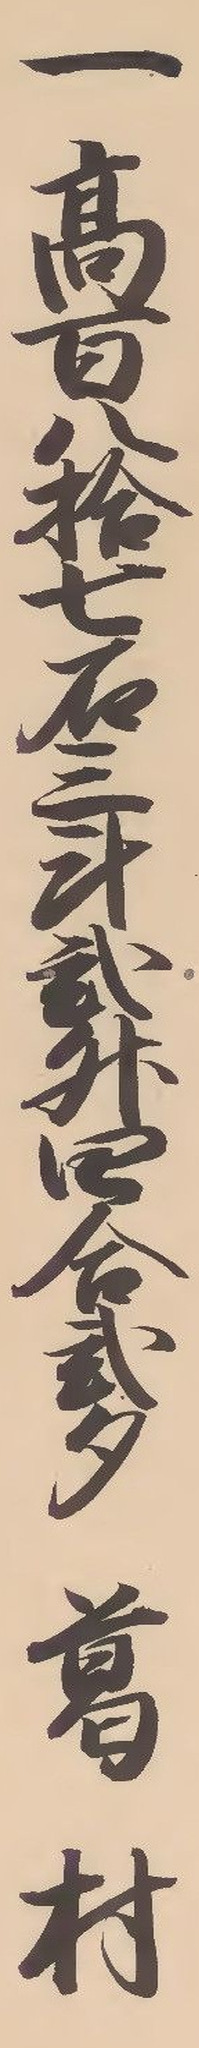一高百八拾七石三斗弐升四合弐勺葛村

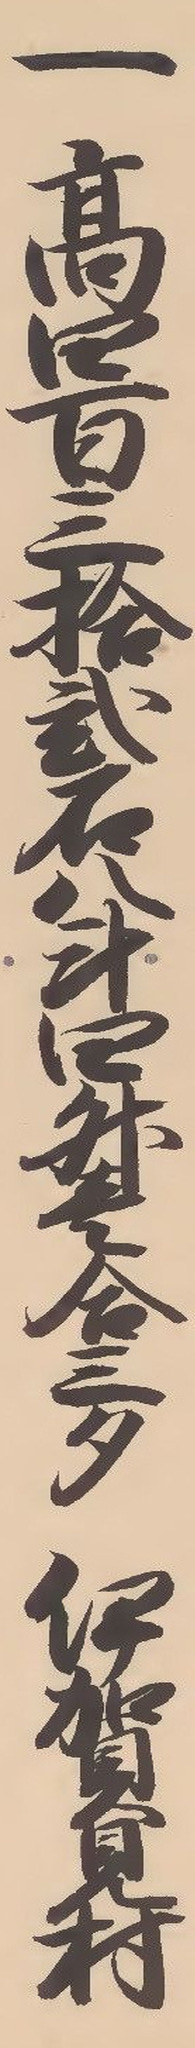一高四百三拾弐石八斗四升壱合三勺伊賀見村
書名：大和国郷帳
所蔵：国立公文書館 National Archives of Japan
